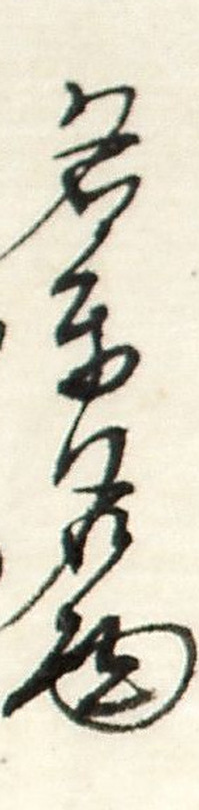名東名西
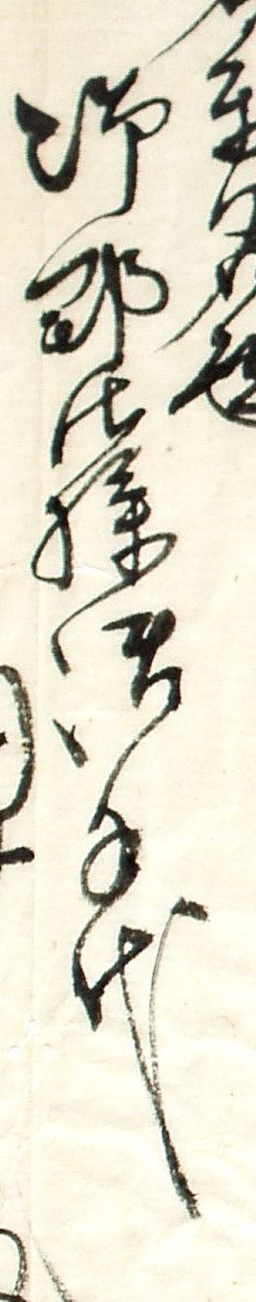御郡代様御手代
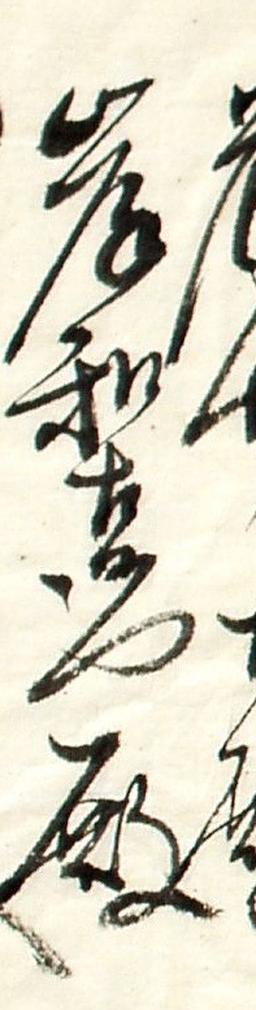岸和左衛門殿
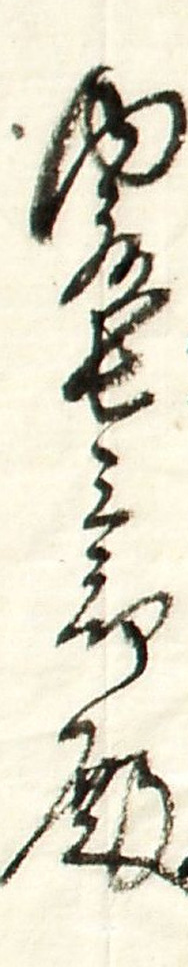内藤長三郎殿
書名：和田村常夜燈寄進浄瑠璃行着書控他
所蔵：鳴門教育大学 Naruto University of Education
